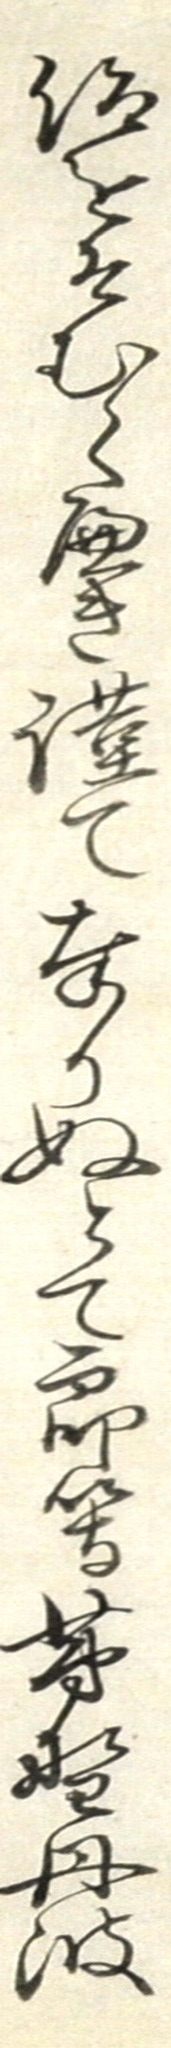仰をそむくへき謹て奉りぬとて郎等茅野丹波
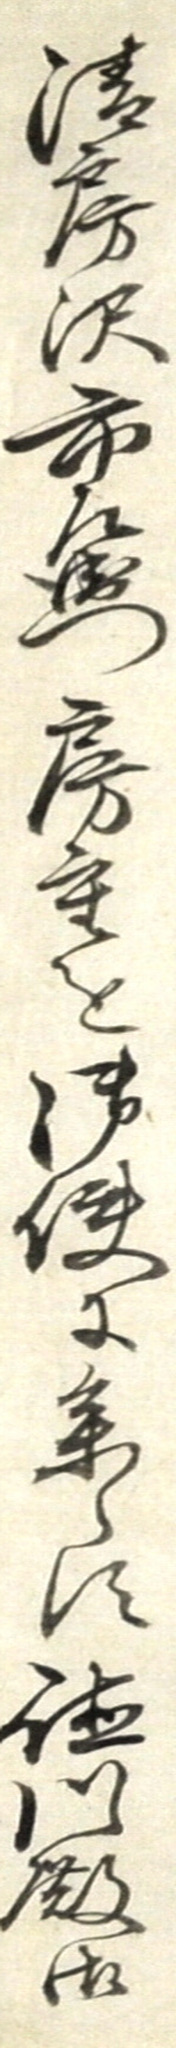清房沢市左衛門房重を御使に参らす徳川殿御
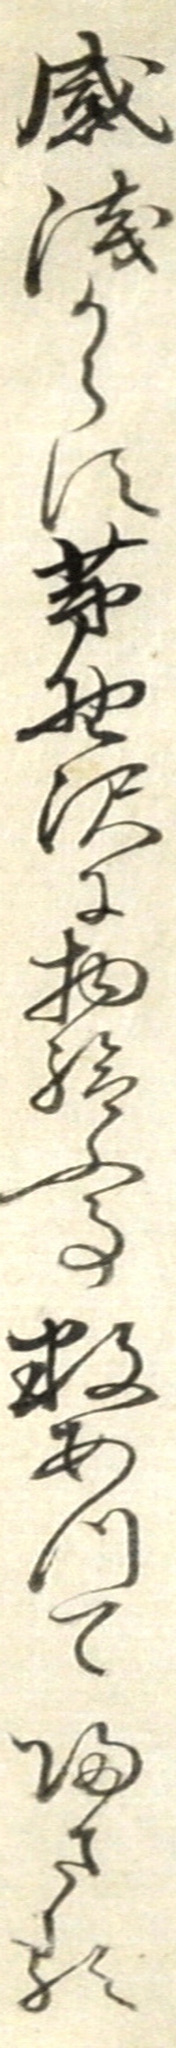感浅からす茅野沢に物給ふ事数あつて帰さる
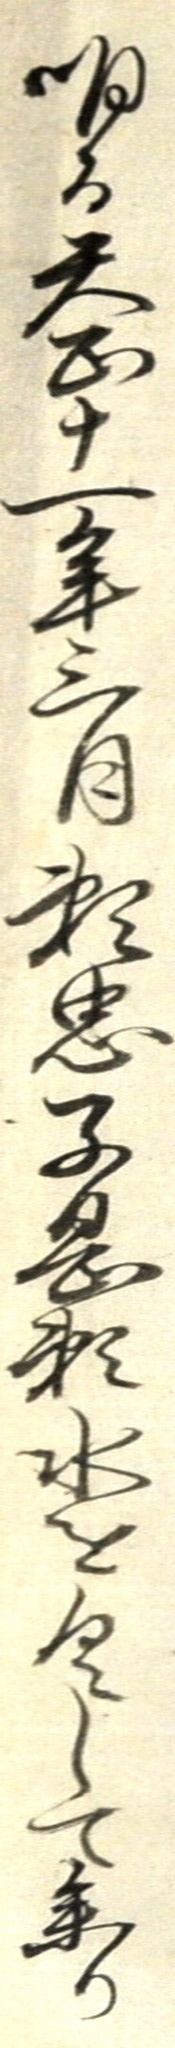明る天正十一年三月頼忠子息頼水を具して参り

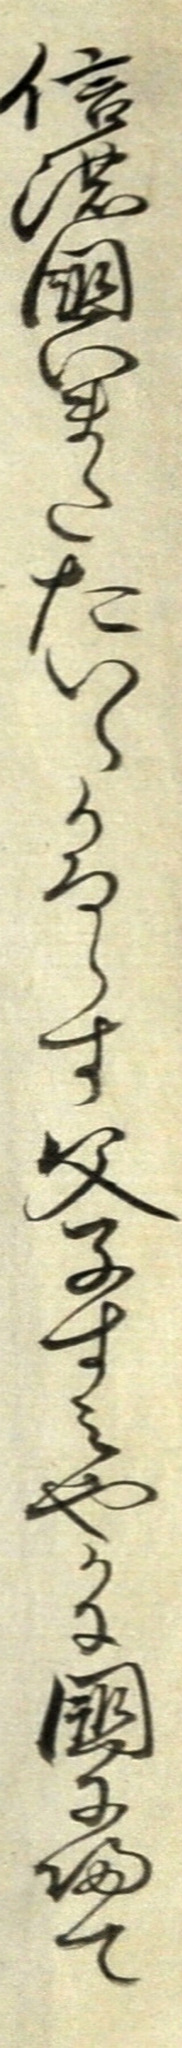信濃国いまたたいらかならす父子すみやかに国に帰て
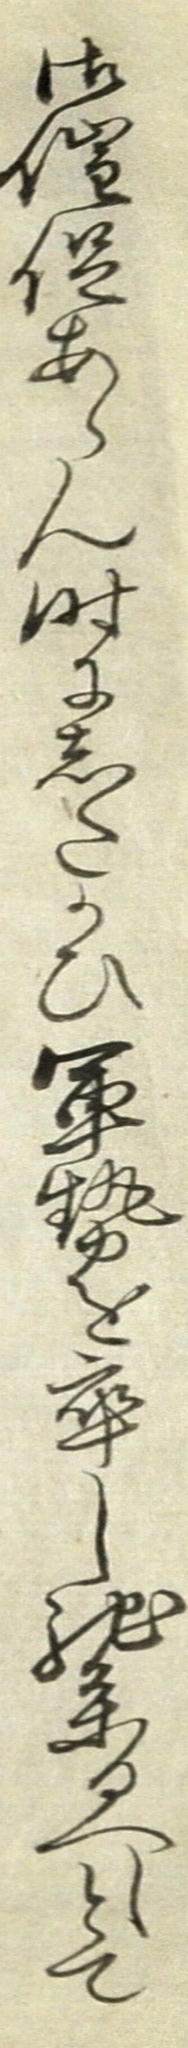御催促あらん時にしたかひ軍勢を率し馳参るへしとて
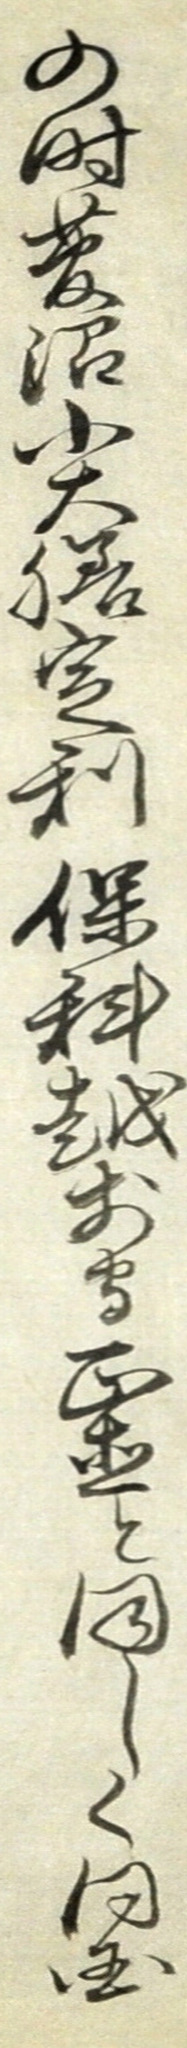の時菅沼小大膳定利保科越前守正直と同しく同国
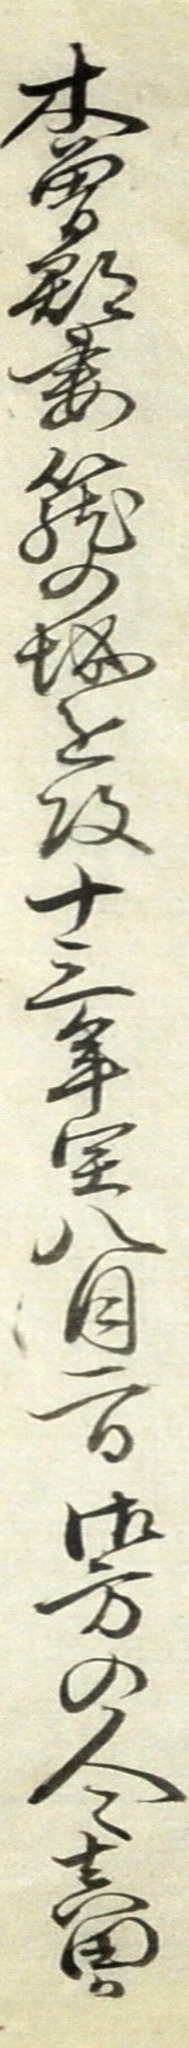木曽郡妻籠の城を攻十三年閏八月二日御方の人々真田か
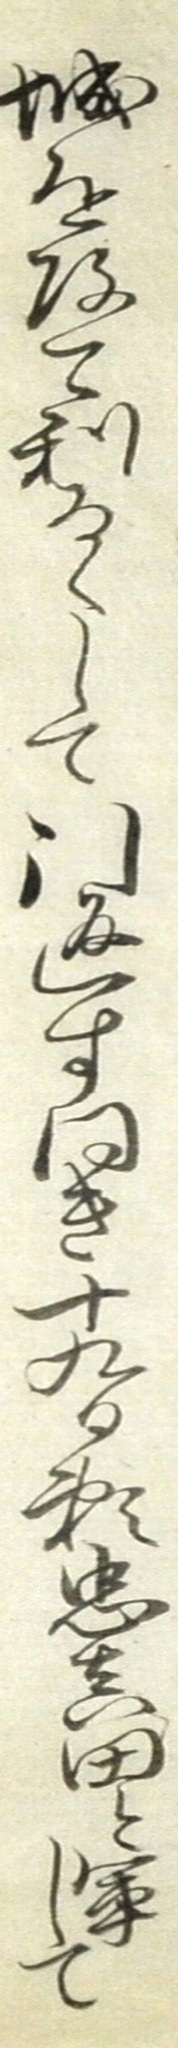城を攻て利なくして引返す同き十九日頼忠真田と軍して
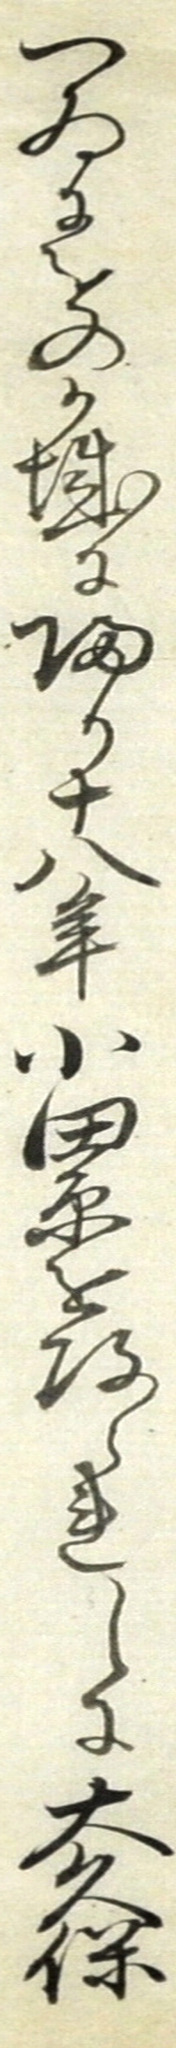つゐにをのか城に帰り十八年小田原を攻られしに大久保
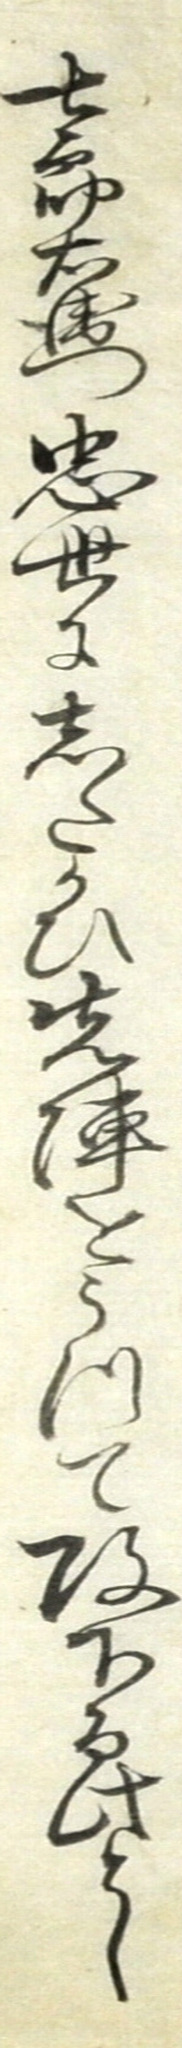七郎右衛門忠世にしたかひ先陣をうつて攻下る此とし
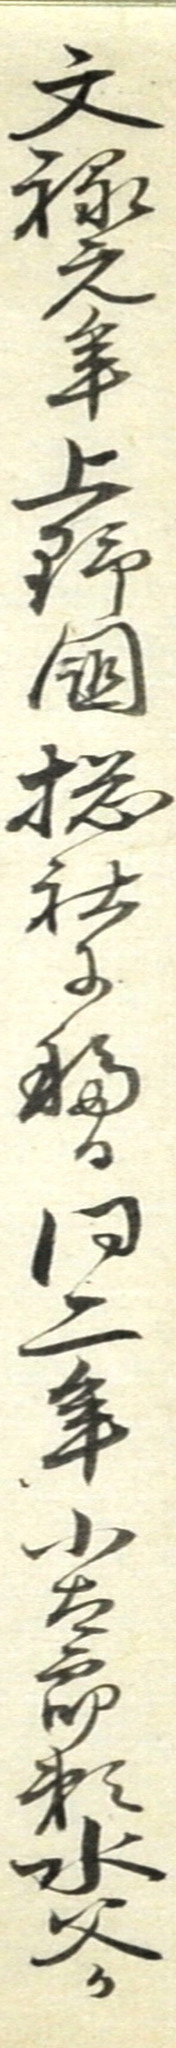文禄元年上野国総社に移る同二年小太郎頼水父か
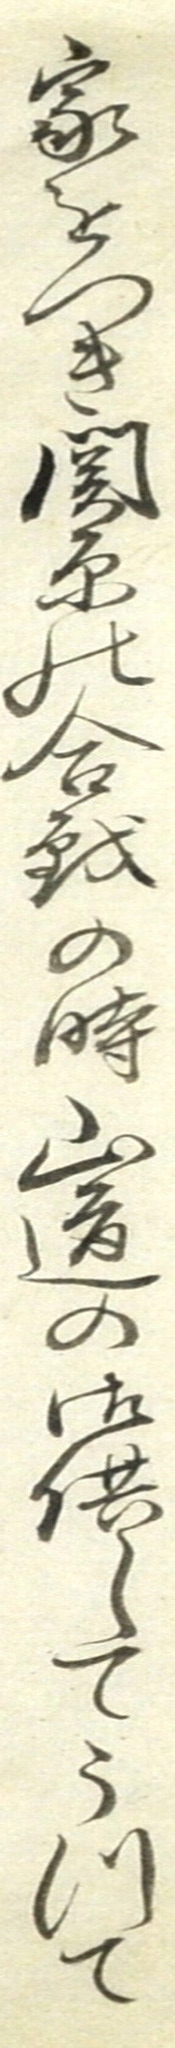家をつき関原の合戦の時山道の御供してうつて
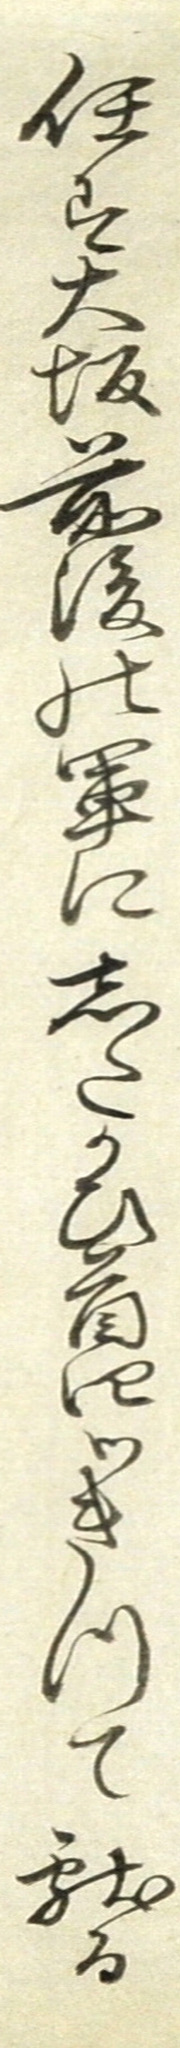任す大坂前後の軍にしたかひ首四ッきつて献る
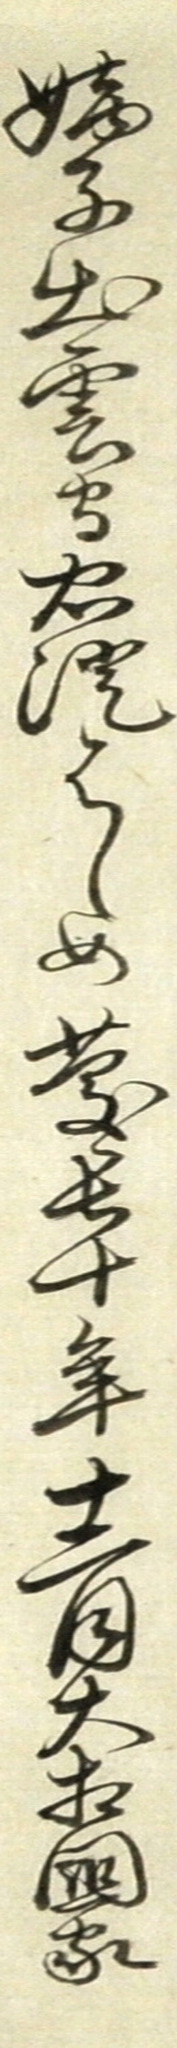嫡子出雲守忠澄はしめ慶長十年十二月大相国家
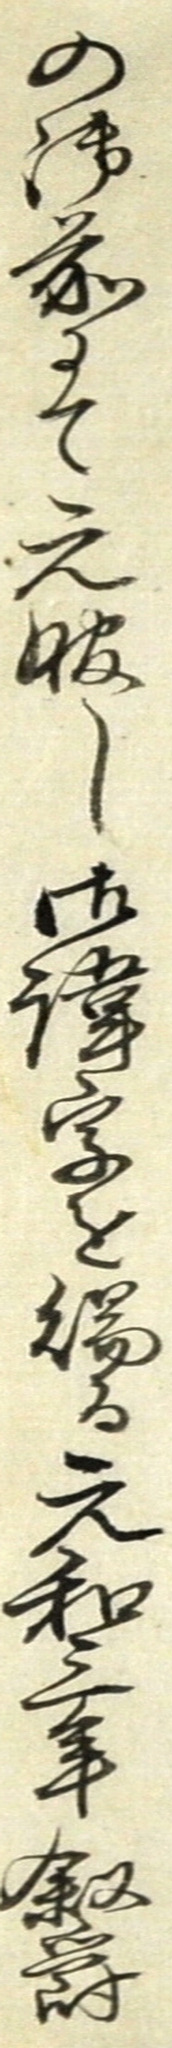の御前にて元服し御諱字を賜る元和三年叙爵
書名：藩翰譜（六）
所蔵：伊那市立高遠町図書館・合同会社AMANE
